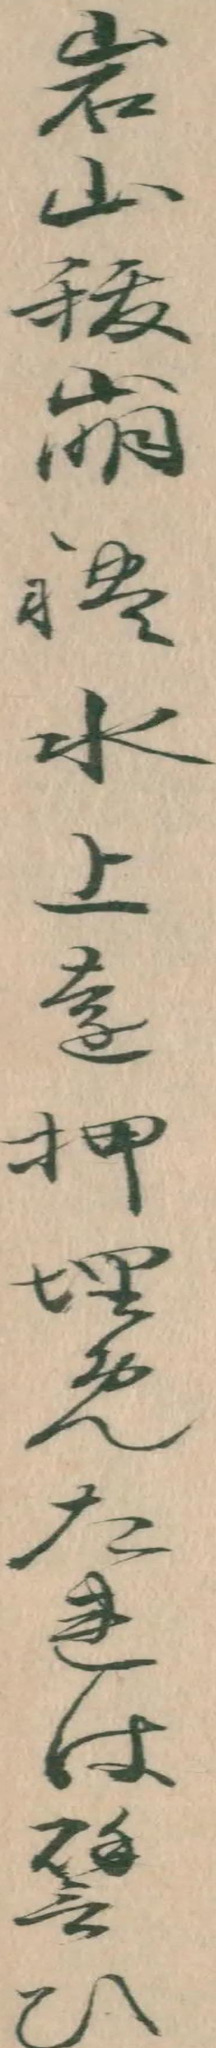岩山抜崩れ水上を押埋めたれは譬ひ
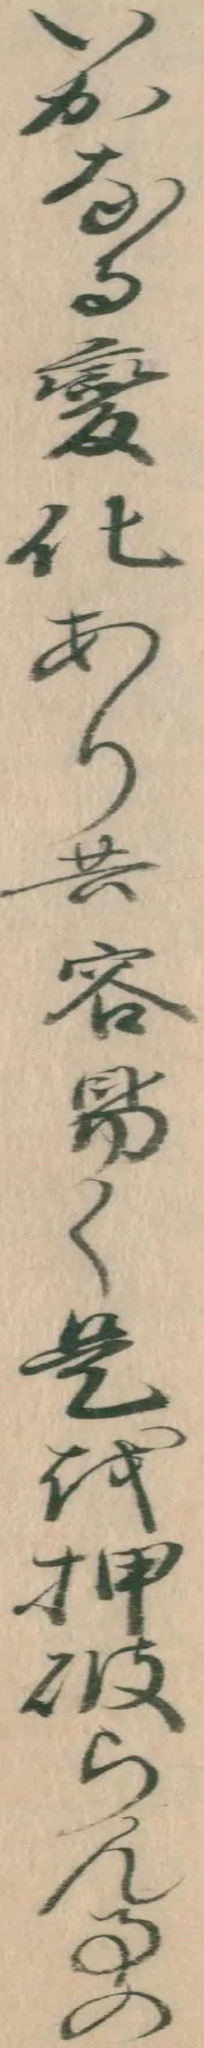いかなる変化あり共容易く是を押破らん事の
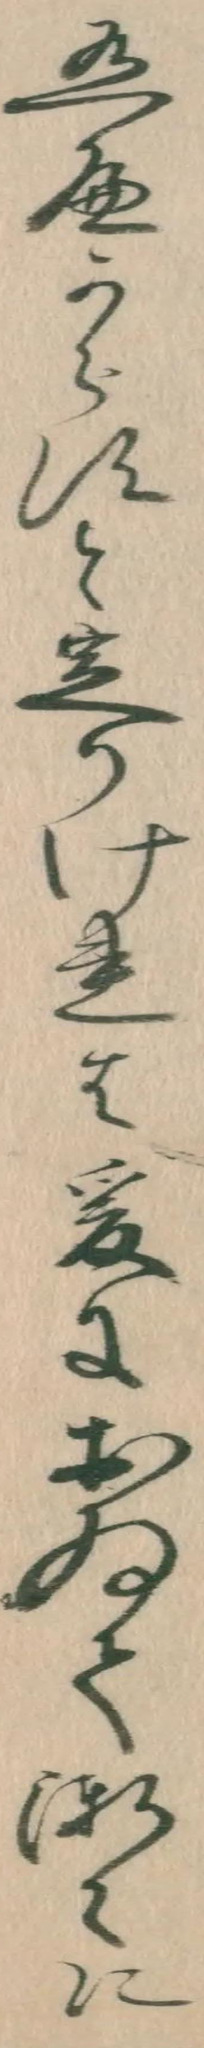有へからすと定りけれは爰におゐて漸〻に
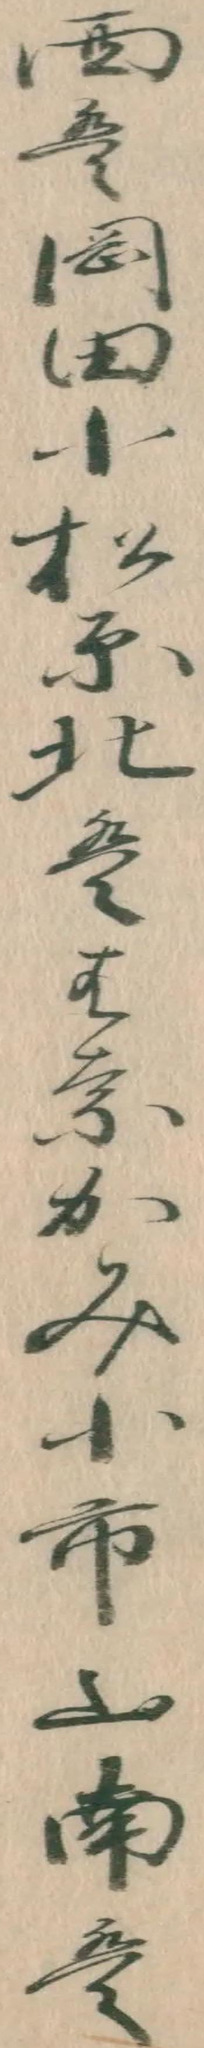西は岡田小松原北ははなかみ小市山南は
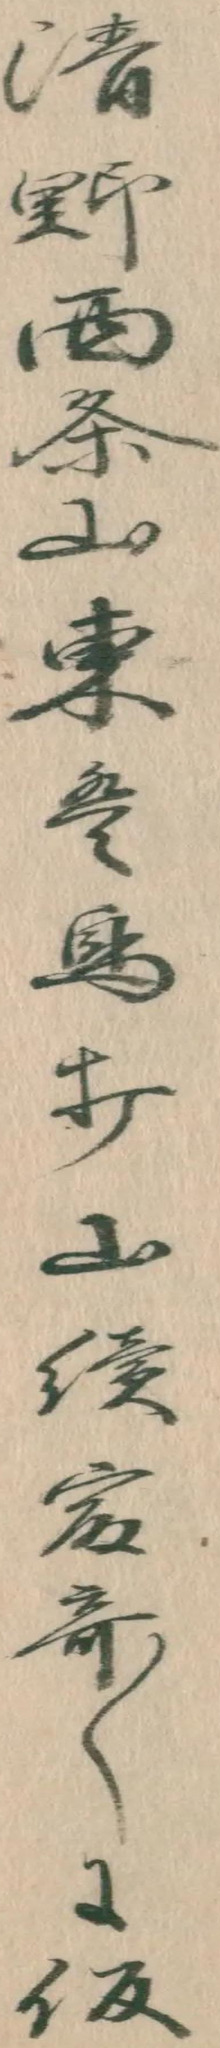清野西条山東は鳥打山続最寄〳〵に仮
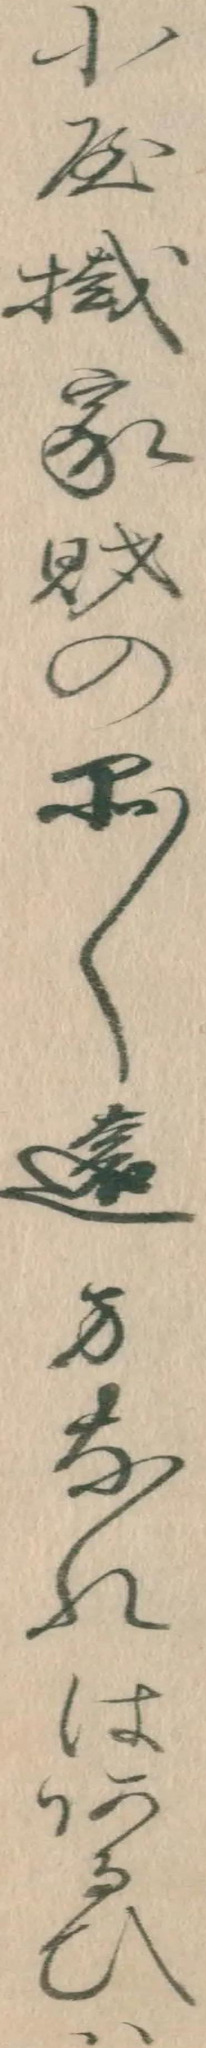小屋掛家財の品〳〵遠方なれはあるひは
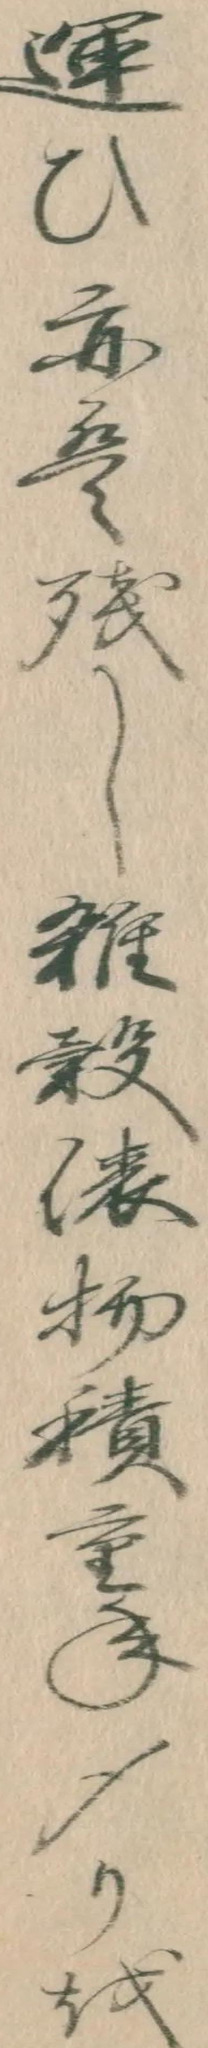運ひ亦は残し雑穀俵物積重ね〆りを
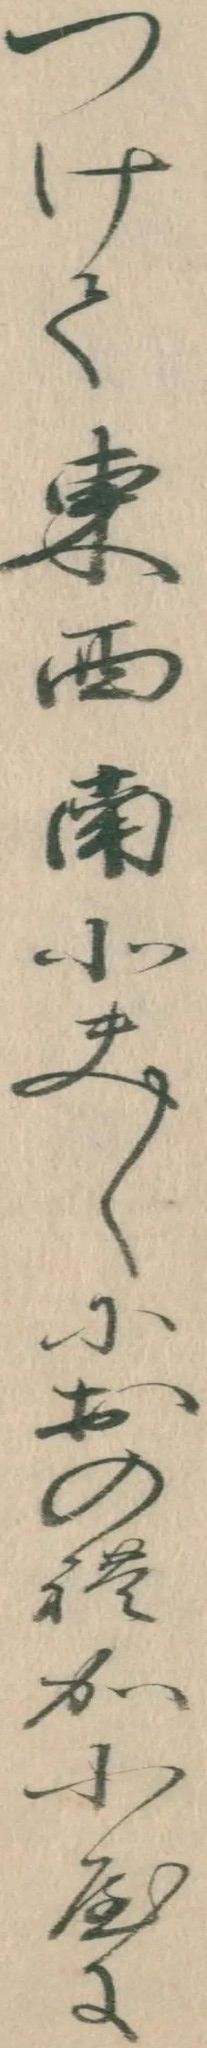つけて東西南北夫〳〵におのれか小屋に
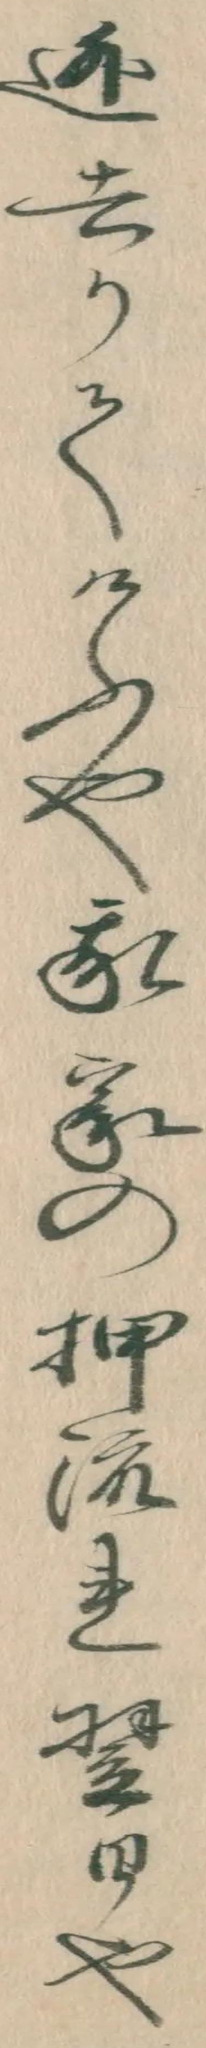逃去りてけふや我家の押流れ翌日や
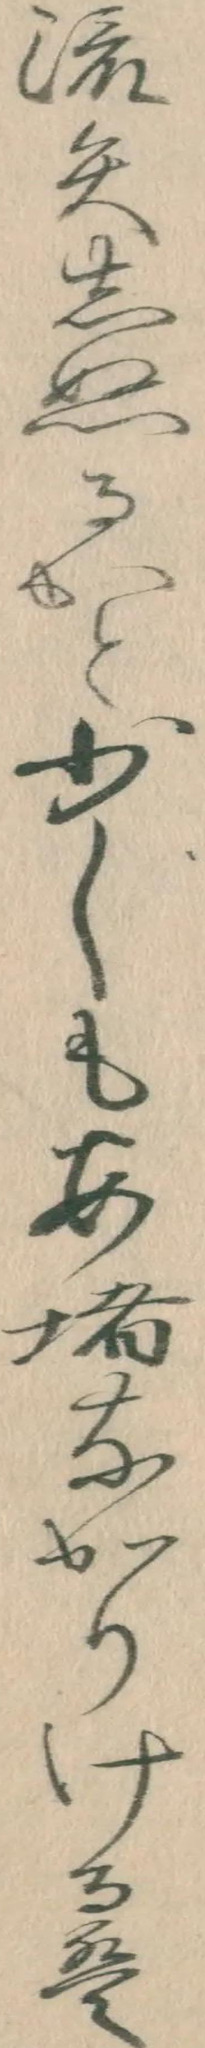流失しぬるかと少しも安堵なかりけるは
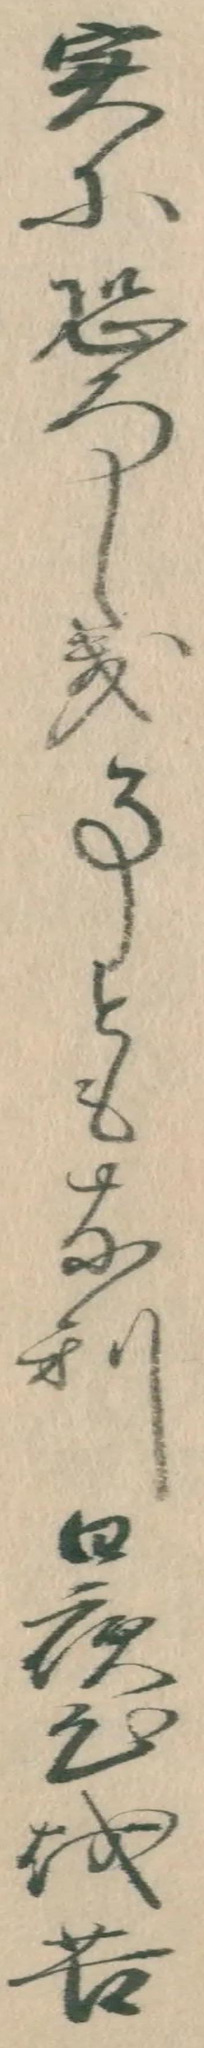実に恐ろしき事ともなり日夜心を苦

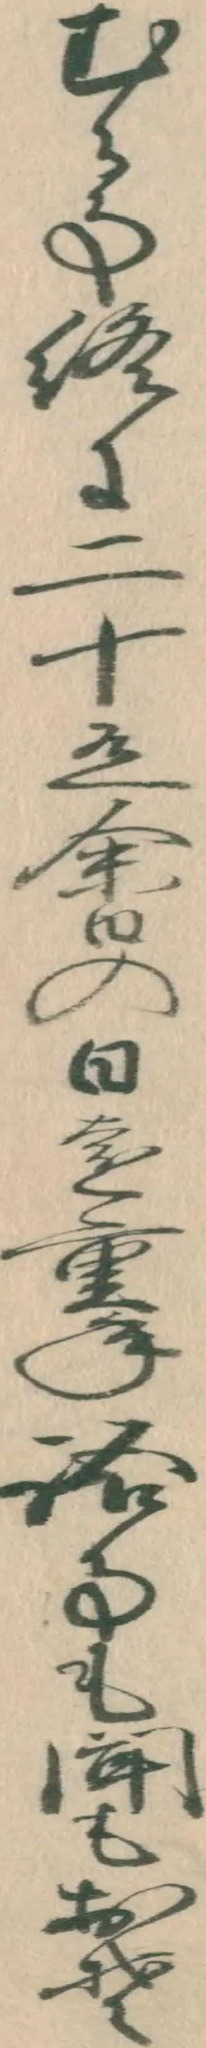むる事終に二十有余日の日を重ね語事も聞もおそ
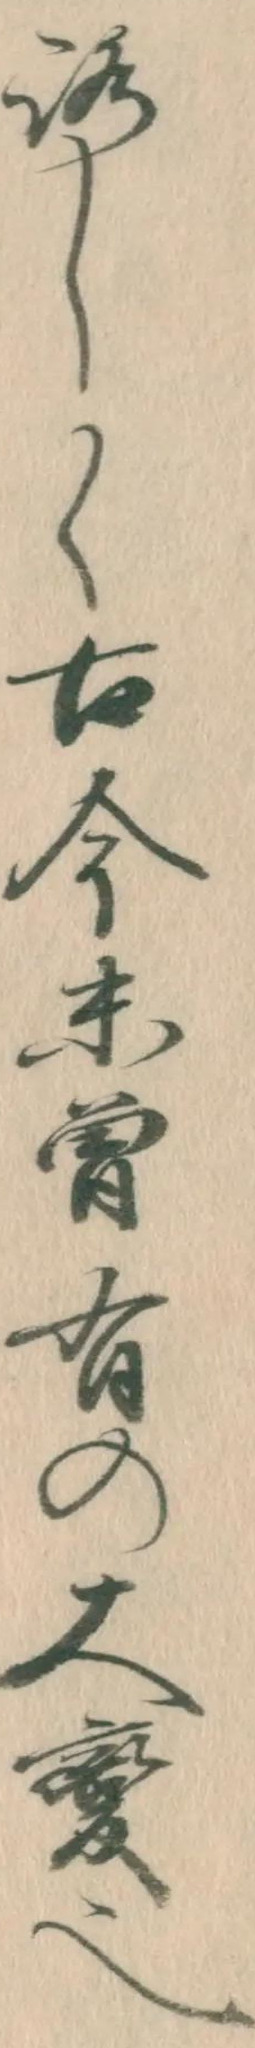ろしく古今未曾有の大変也
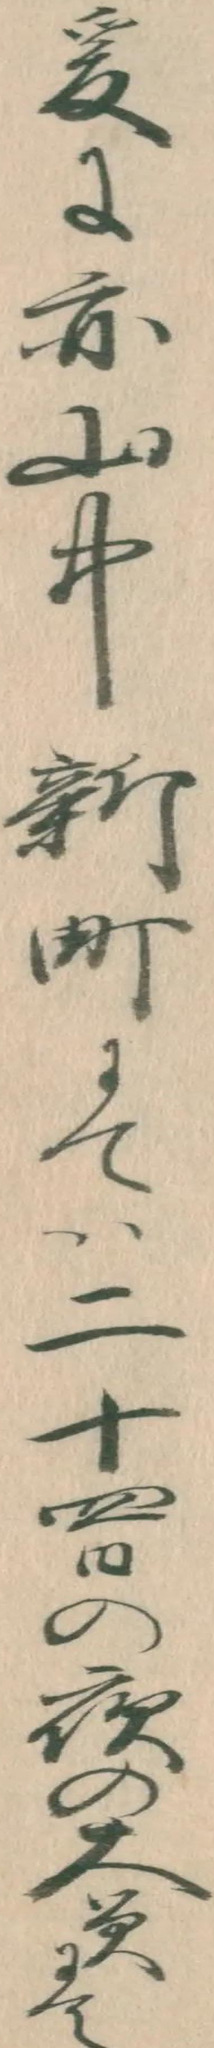爰に亦山中新町にては二十四日の夜の大災にて
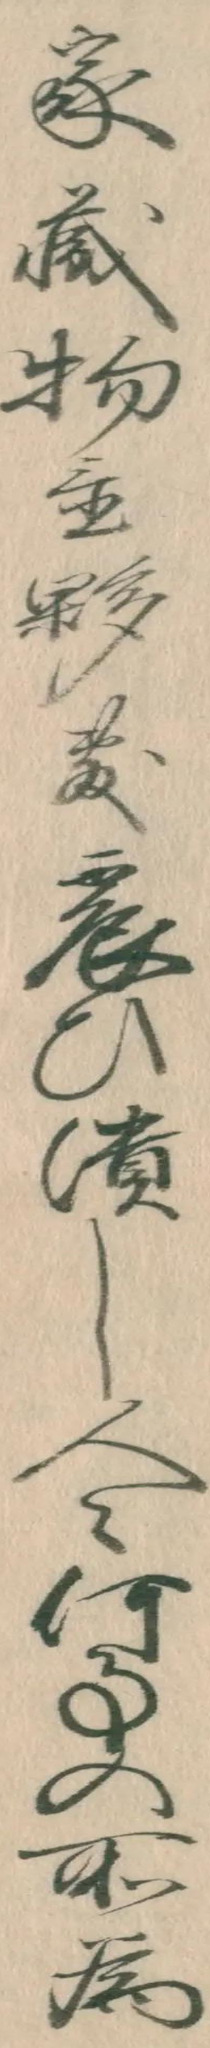家蔵物置夥敷震ひ潰し人〻何事の所為
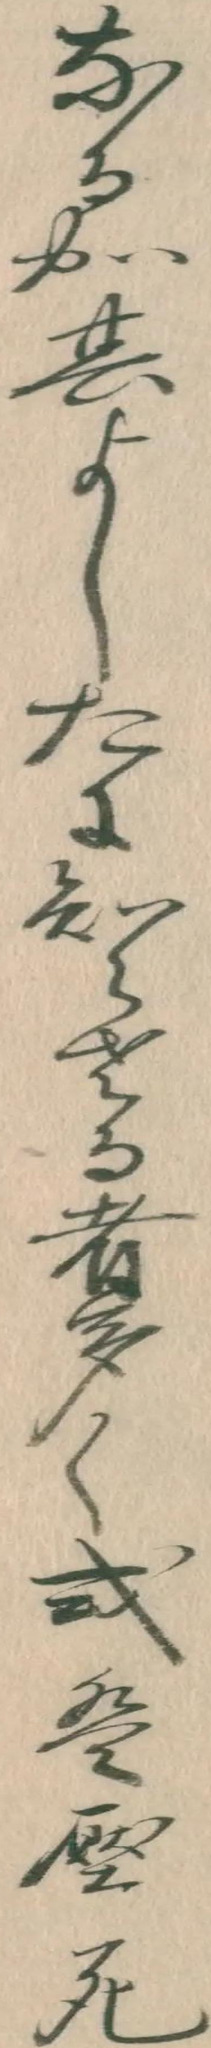なるか其よしたに知らさる者多く或は圧死
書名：俗語之種. [6]
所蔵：国立国会図書館 National Diet Library, JAPAN
